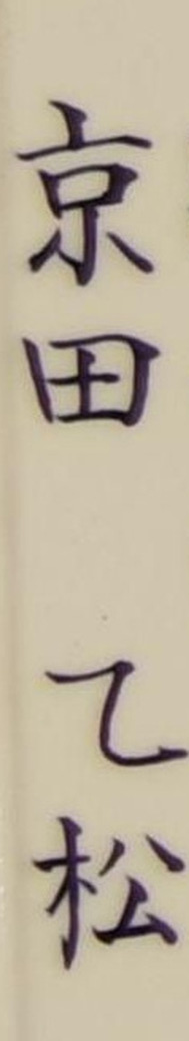京田乙松

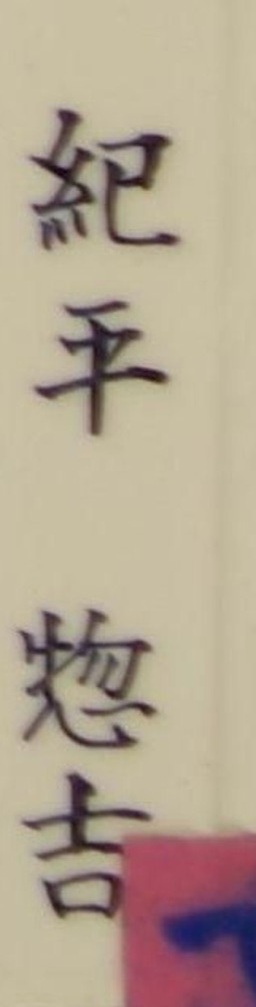紀平惣吉
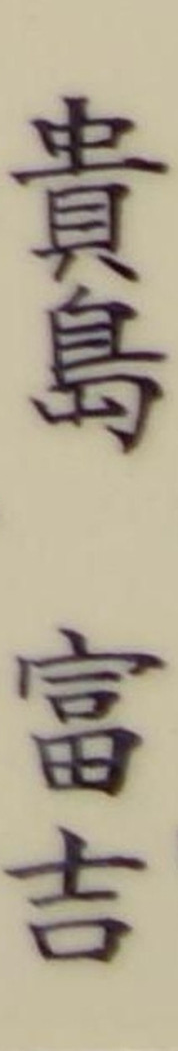豊島富吉
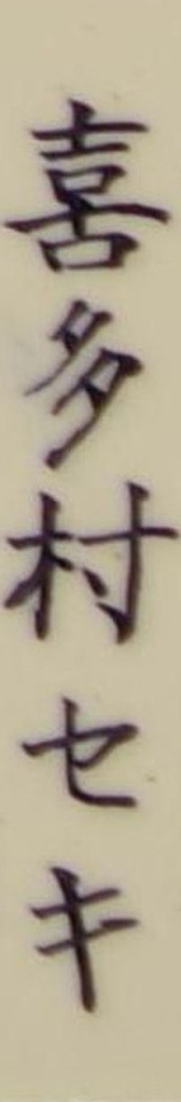喜多村セキ
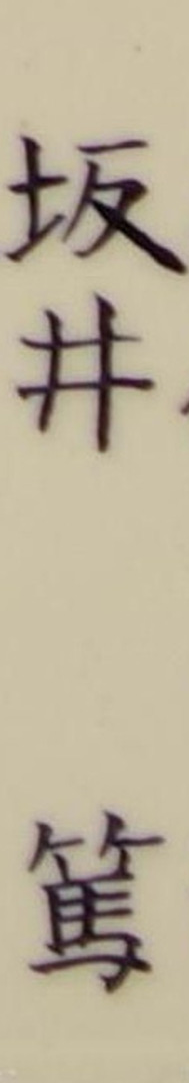坂井篤
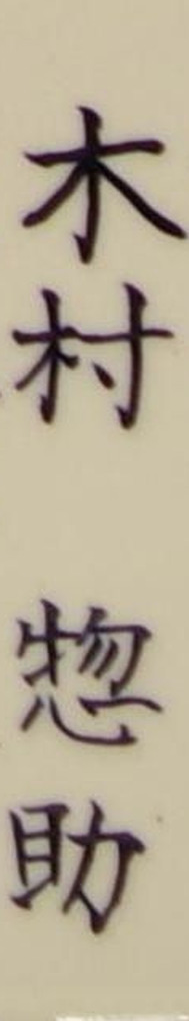木村惣助
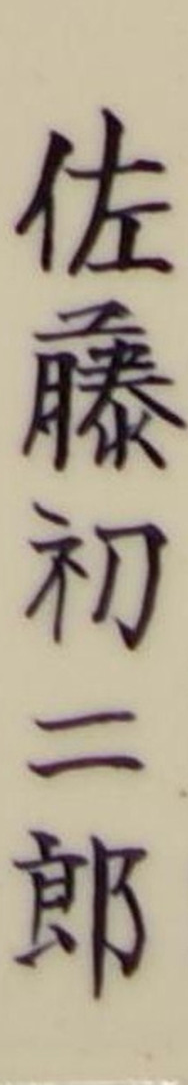佐藤初二郎
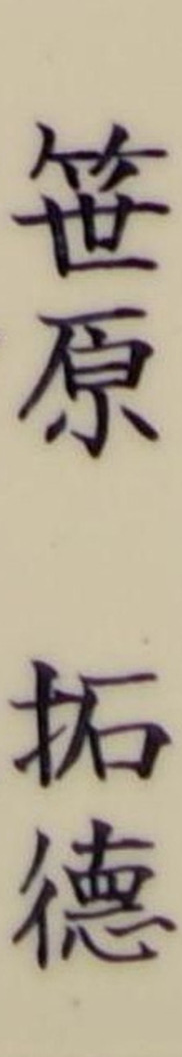笹原拓徳
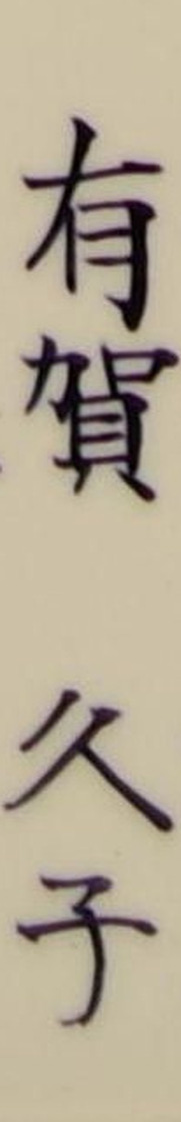有賀久子
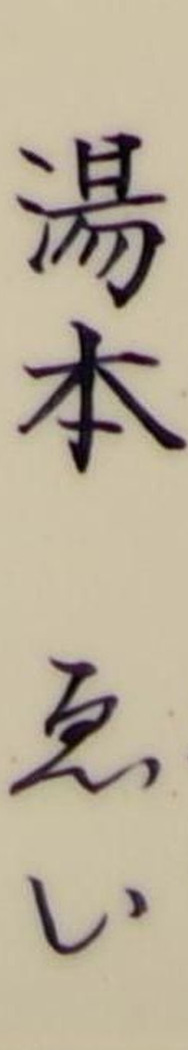湯本ゑい
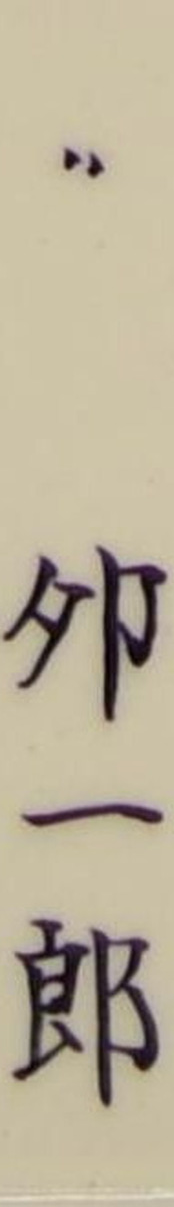卯一郎
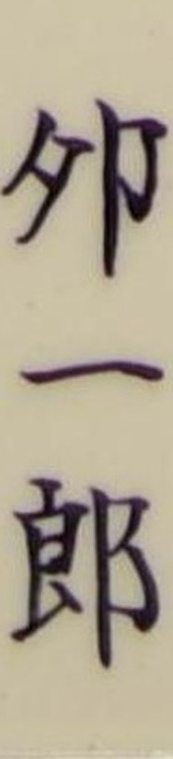卯一郎
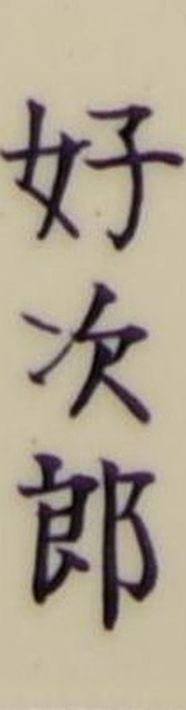好次郎
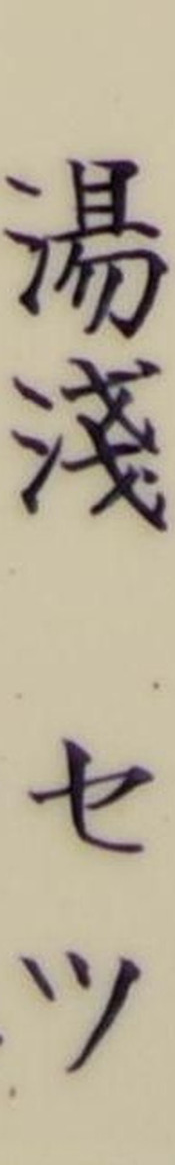湯浅セツ
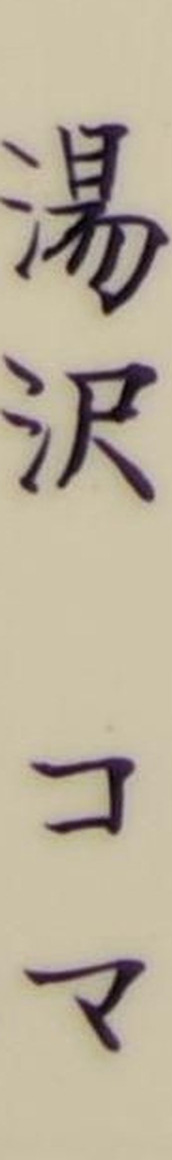湯沢コマ
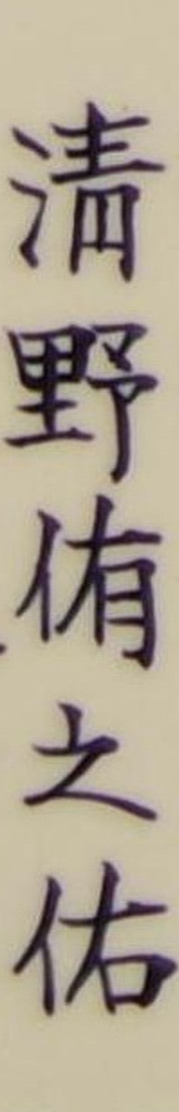清野侑之佑
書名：E~L
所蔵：高野山金剛峯寺
